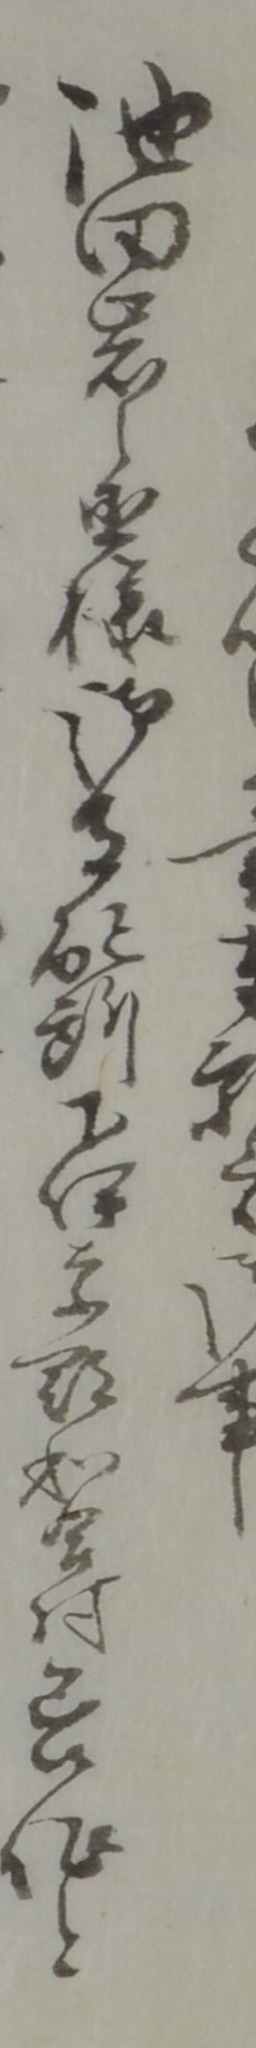池田岩之丞様御支配所下伊奈郡和合村善作と
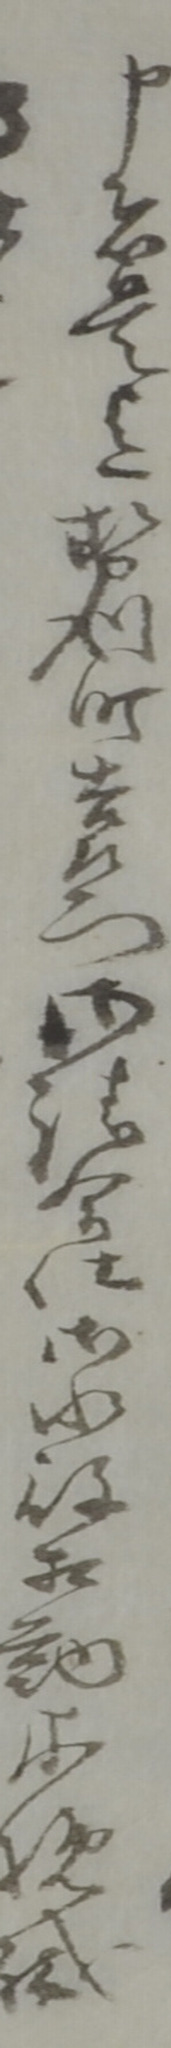申者是迄勢利町吉左衛門御請合仕御水役相勤木挽職
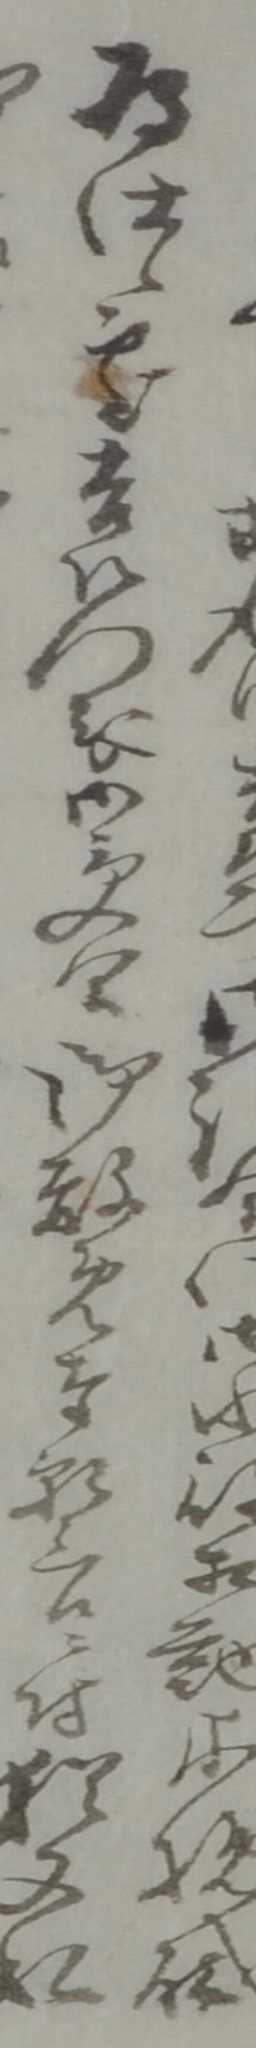為仕候處吉左衛門義御受合御赦免奉願上候ニ付猶又私
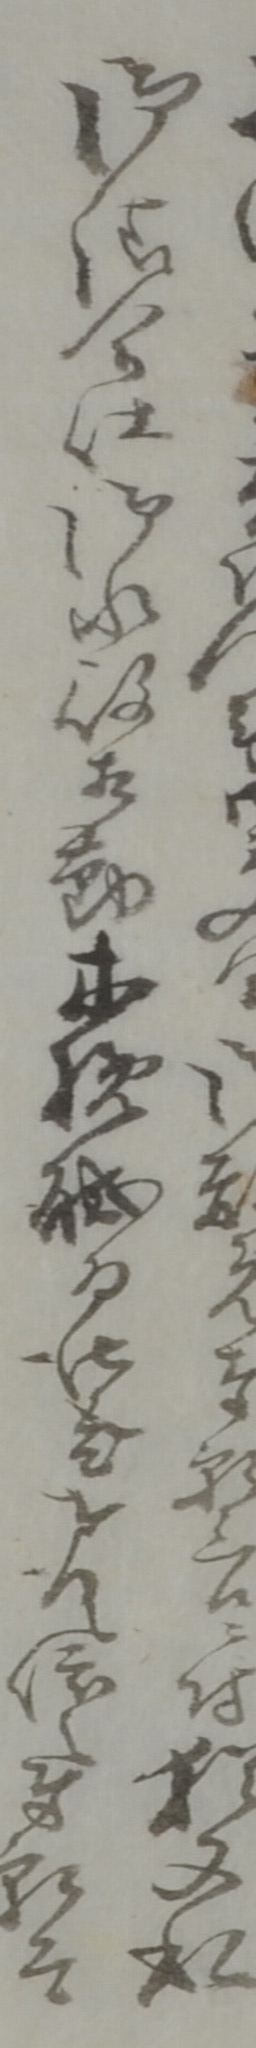御請合仕御水役相勤木挽職為仕度奉存候依之奉願上候

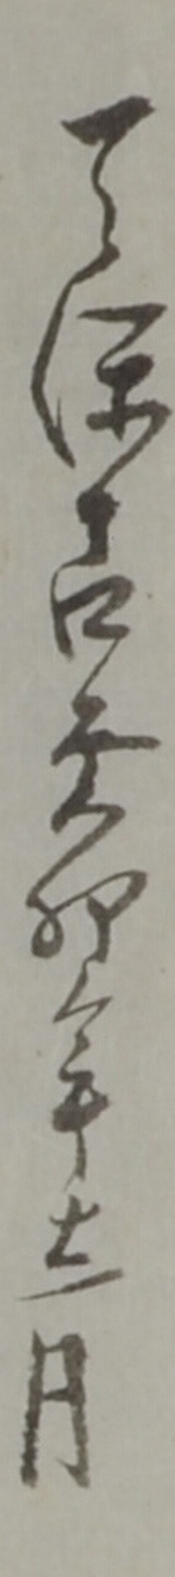天保十四癸卯年十二月
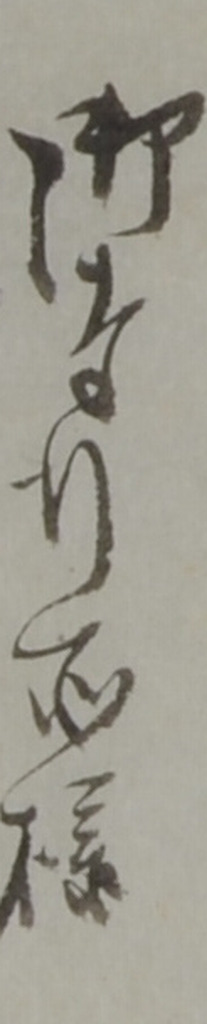御奉行所様
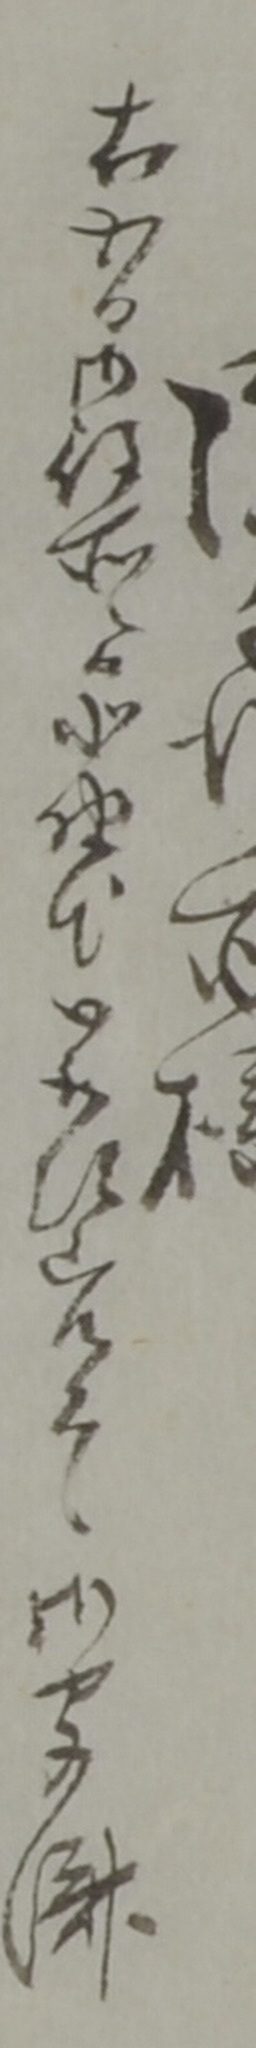右五日御役所ニ而北野氏御取次差上候御聞済
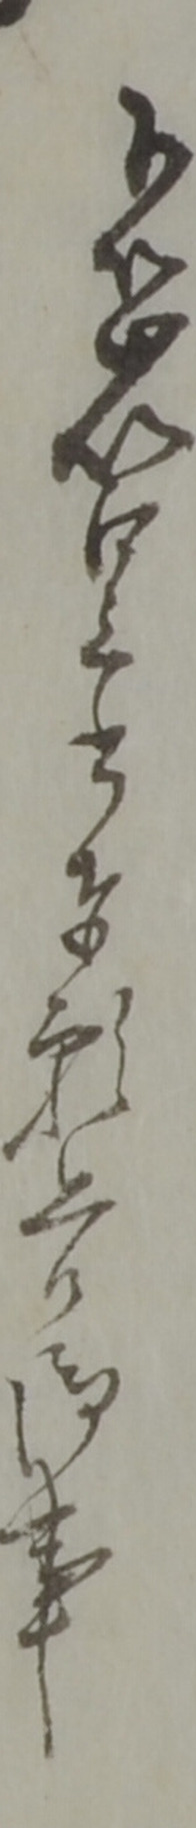乍恐以口上書奉願上候御事
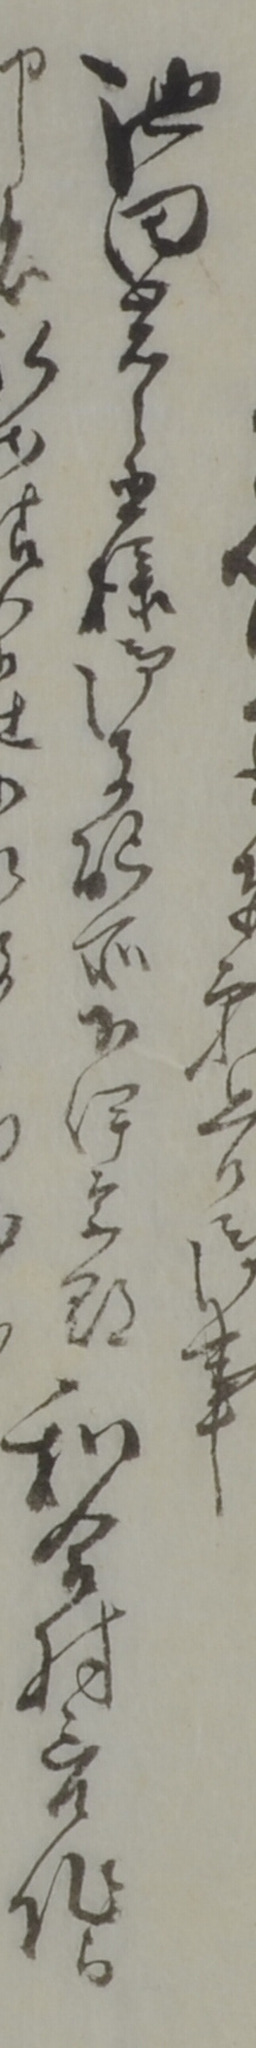池田岩之丞様御支配所下伊奈郡和合村善作と
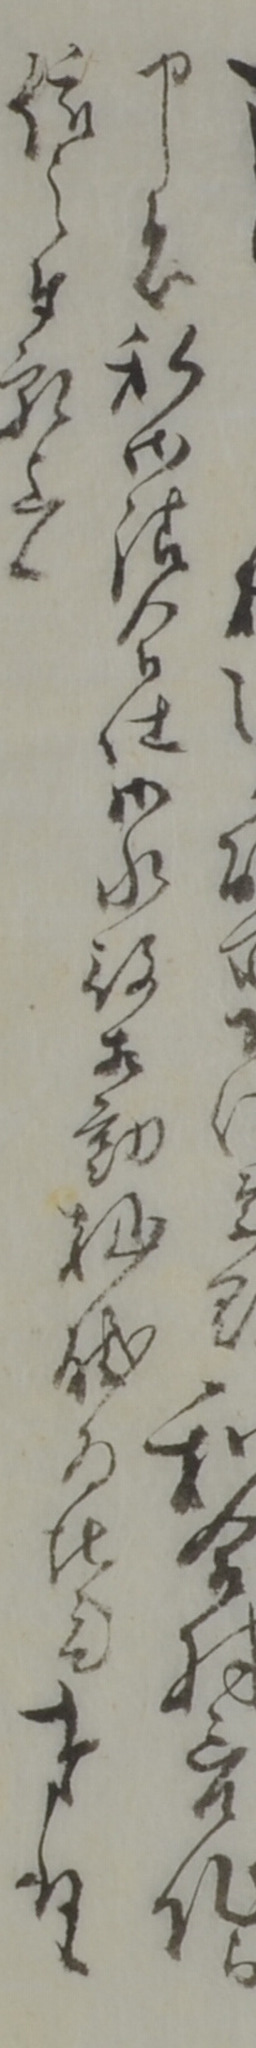申者私御請合仕御水役相勤杣職為仕度奉存候
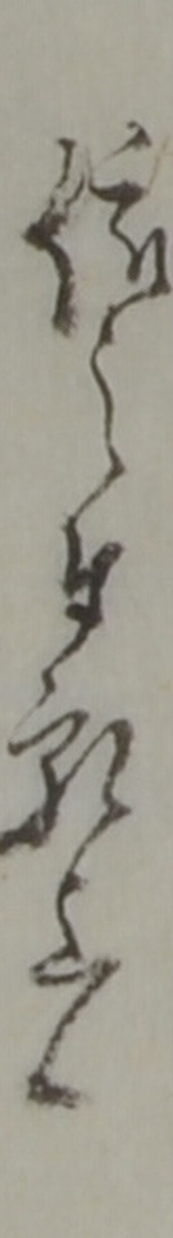依之奉願上候
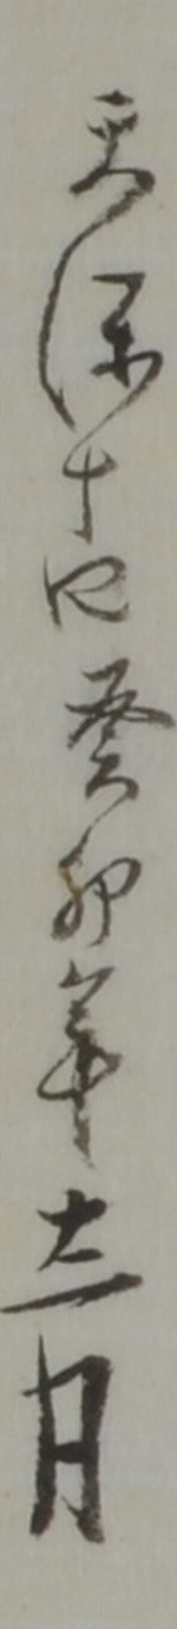天保十四癸卯年十二月
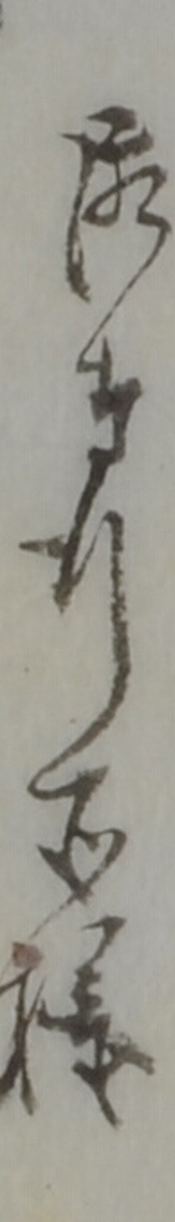御奉行所様
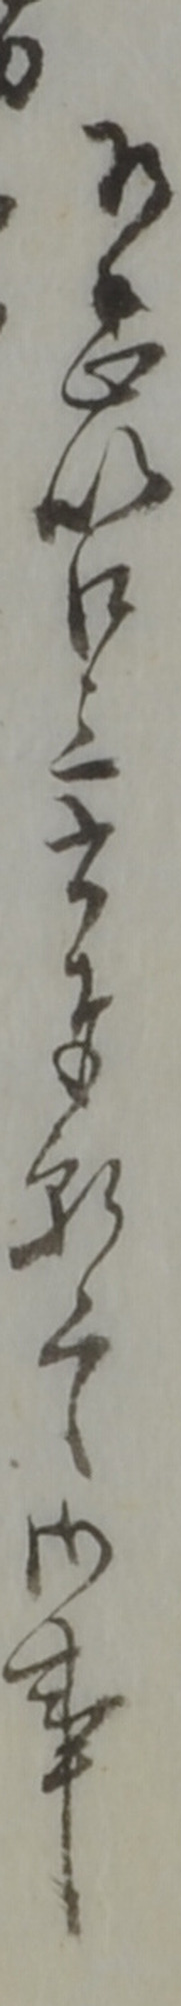乍恐以口上書奉願上候御事
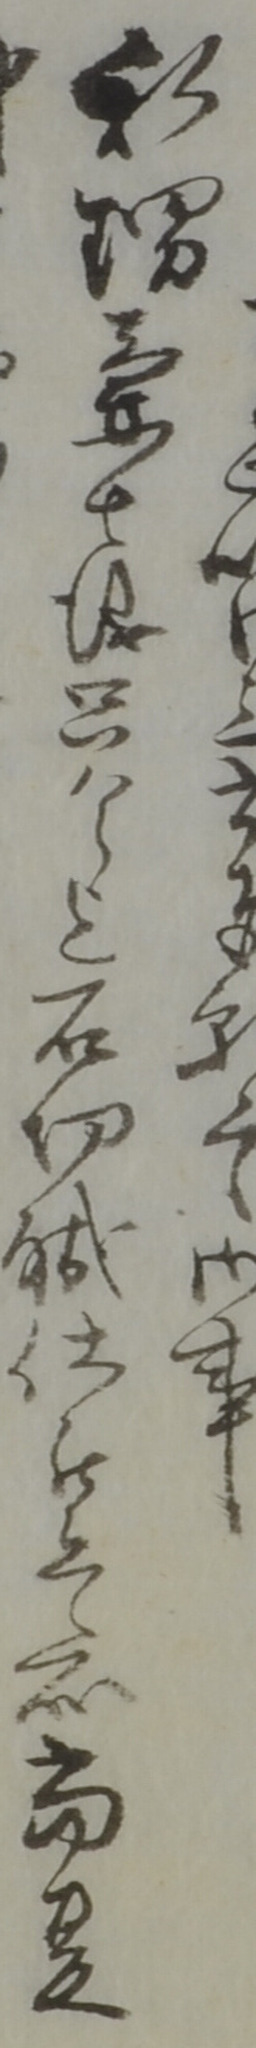私甥嘉七儀只今迄石切職仕罷在候所当夏
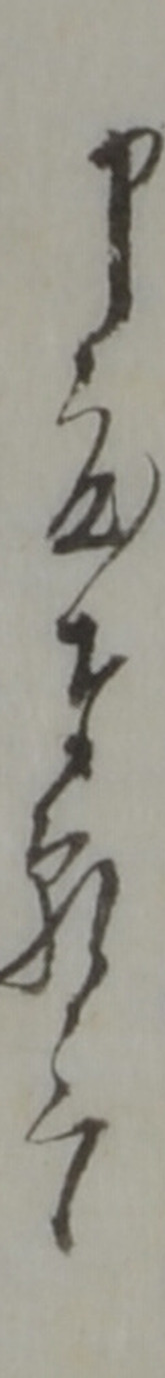申度奉願上候
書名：諸願書控簿
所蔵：伊那市立高遠町図書館・合同会社AMANE
